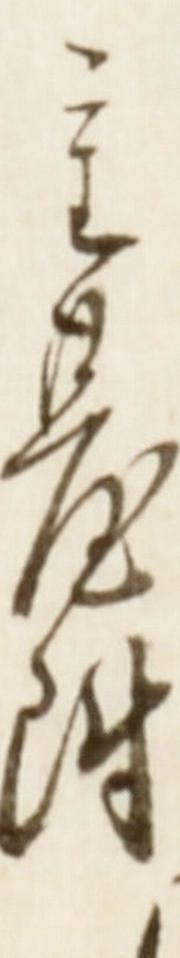重台附
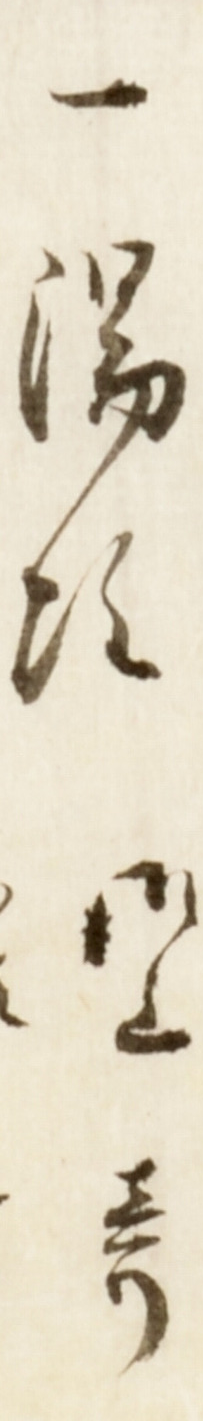一湯次御上壱ツ
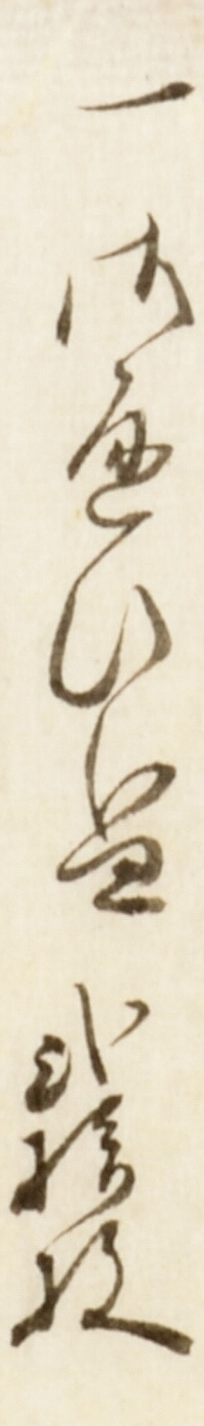一御通ひ盃弐拾枚
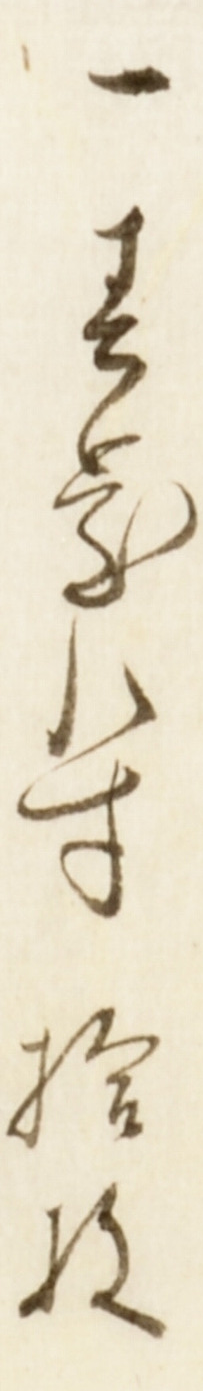一素国八寸拾枚
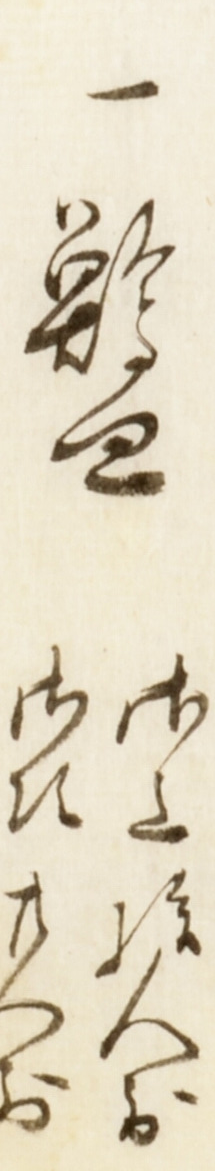一鱠皿御上拾人前
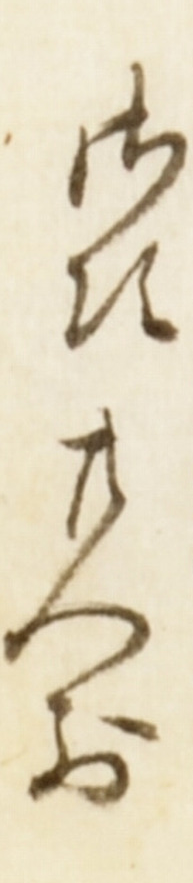御次廿人前
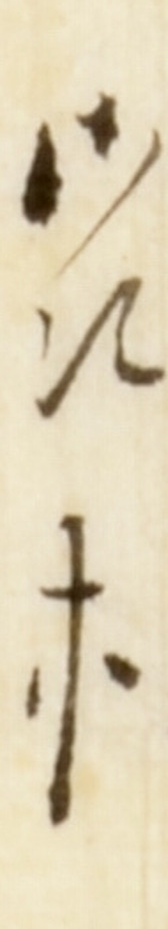御次等
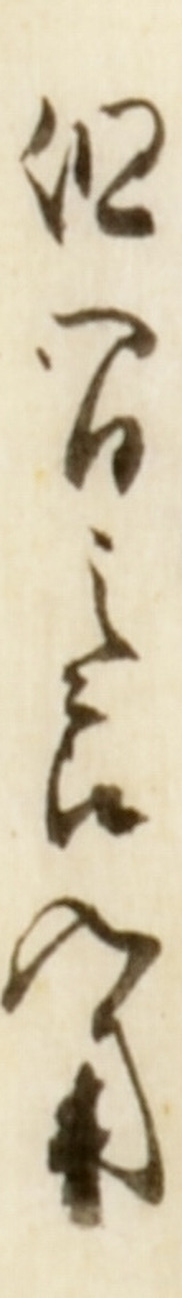但間之節入用
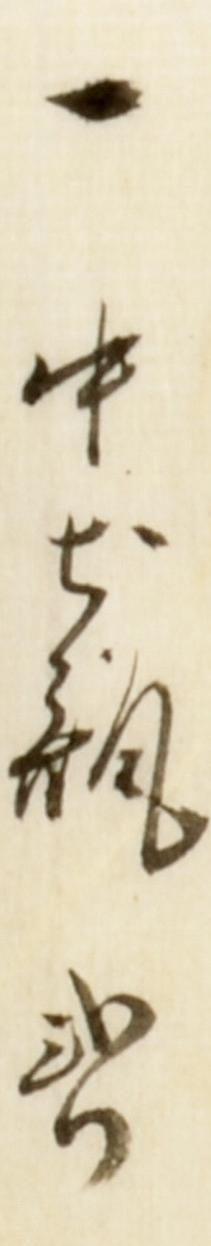一中土瓶弐ツ
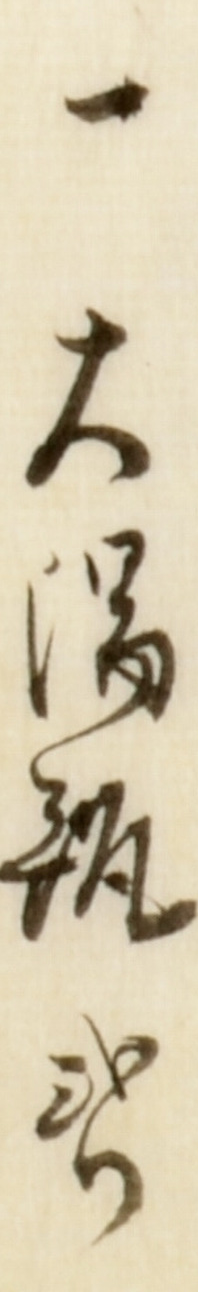一大湯瓶弐ツ
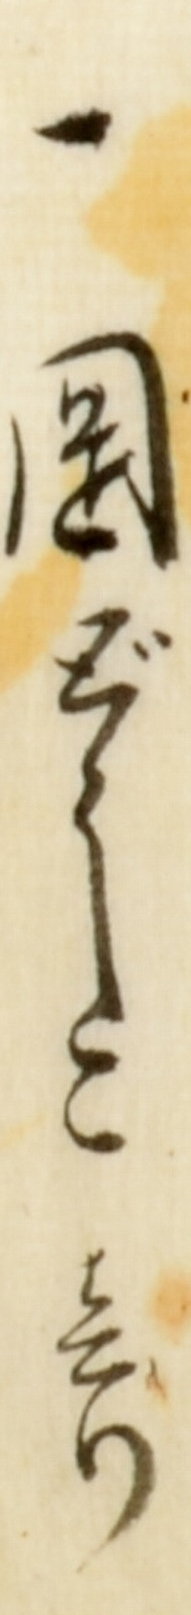一岡どうこ壱ツ

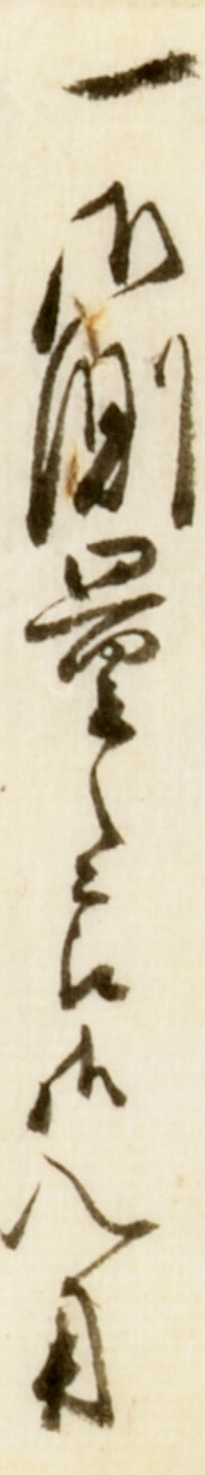一御測量之節御入用
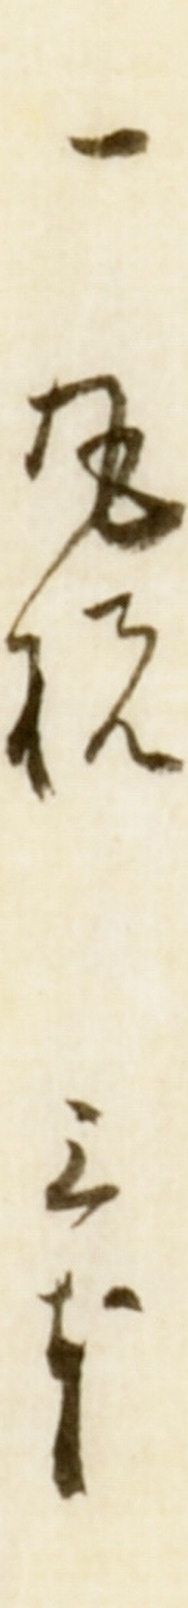一丸杭三本
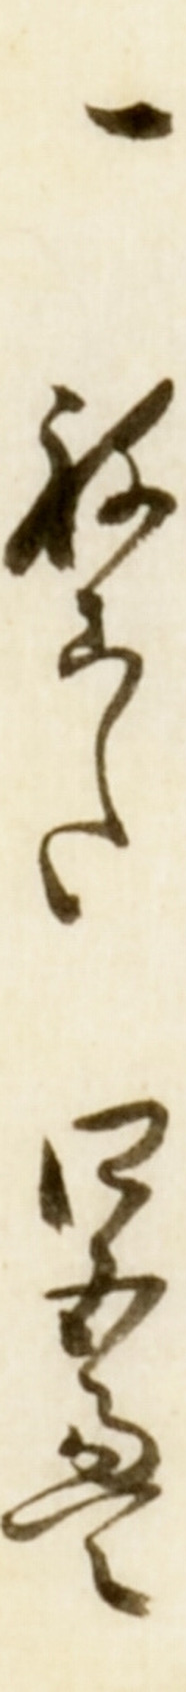一ねこた四五畳
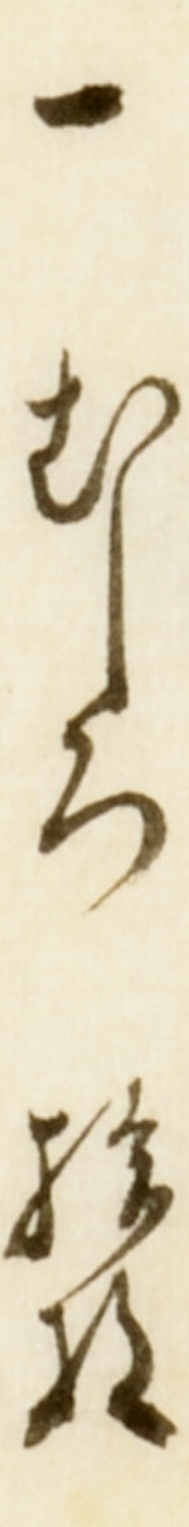一むしろ拾枚
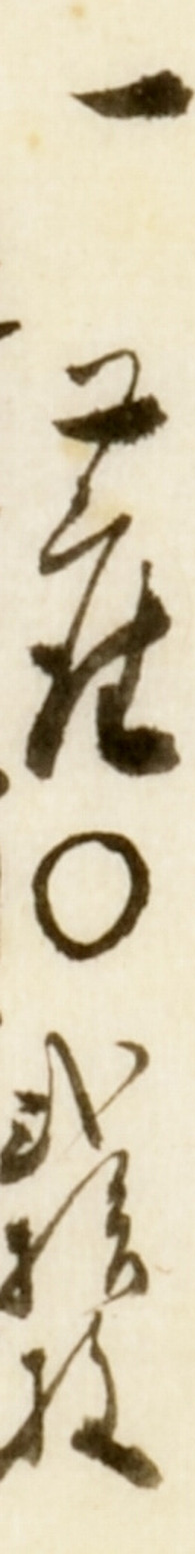一蓙○弐拾枚
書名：覚
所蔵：伊那市立高遠町図書館・合同会社AMANE
